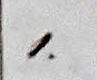1.
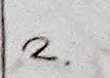2.
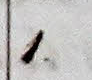1.
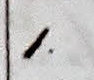1.
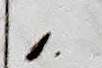1.
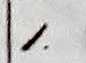1.
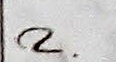2.
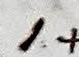1.
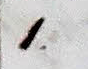1.
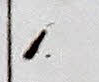1.
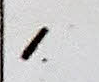1.
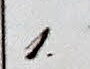1.
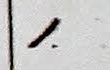1.
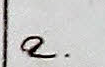2.
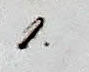1.
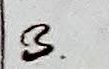3.
